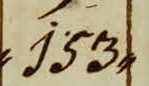153
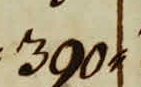390
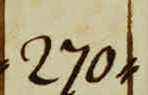270
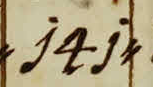141
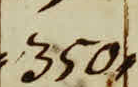350
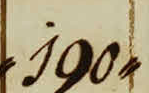190
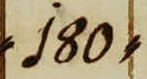180
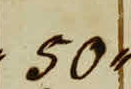50
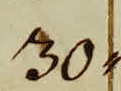30
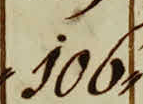106
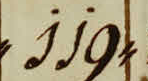119
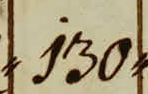130
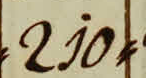210
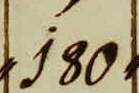180
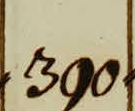390
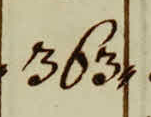363
